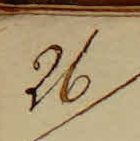26
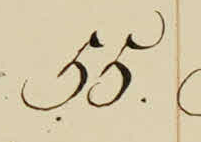55.
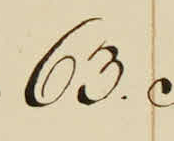63.
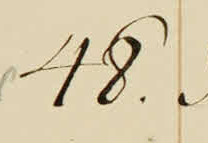48.
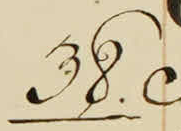38.
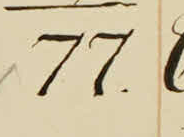77.
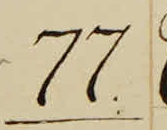77.
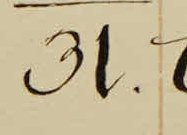31.
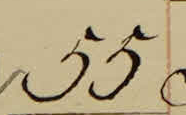55
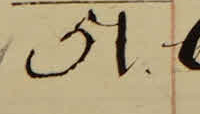51.
